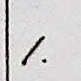1.
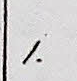1.
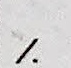1.
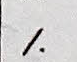1.
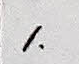1.
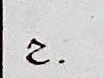2.
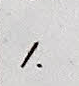1.
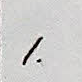1.
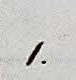1.
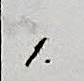1.
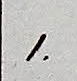1.
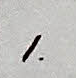1.
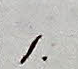1.
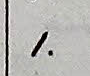1.
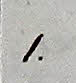1.
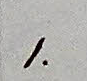1.
